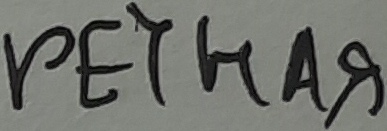речная
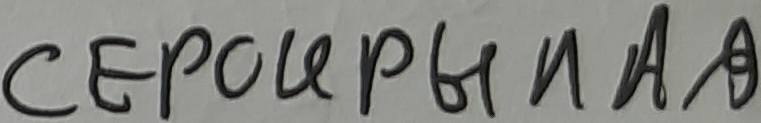серокрылая
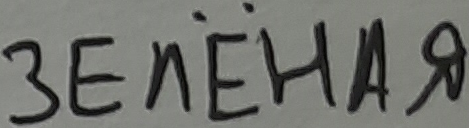зелёная
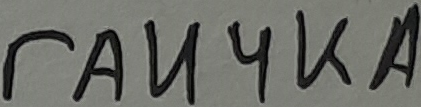гаичка
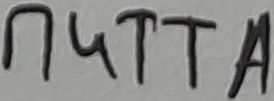питта
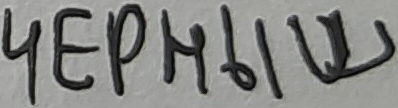черныш
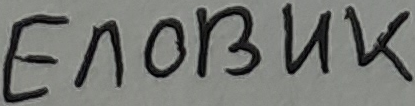еловик
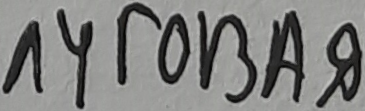луговая
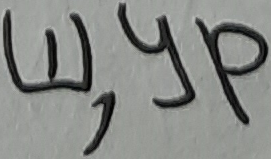щур
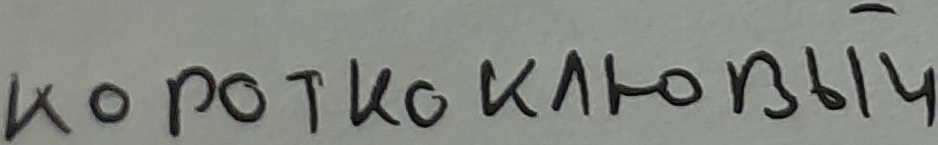короткоклювый
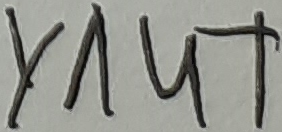улит
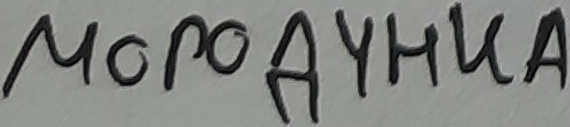мородунка
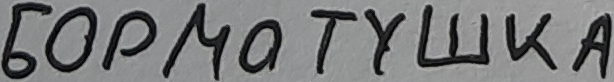бормотушка
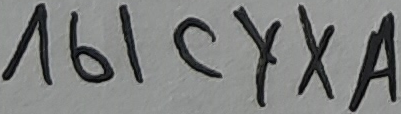лысуха
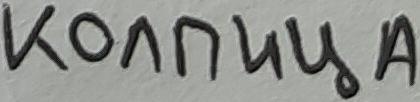колпица
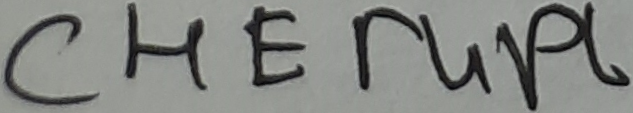снегирь
